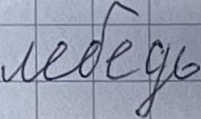лебедь
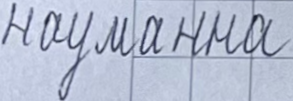науманна
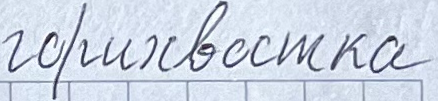горихвостка
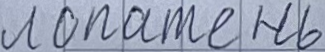лопатень
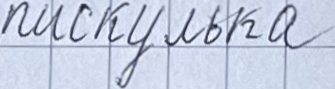пискулька
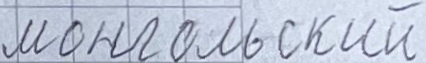монгольский
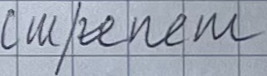стрепет
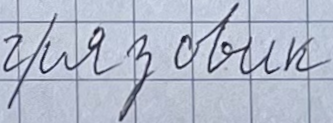грязовик
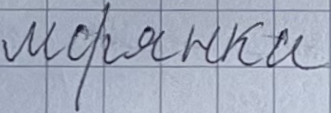морянка
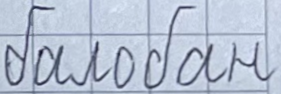балобан
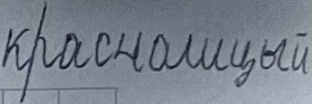краснолицый
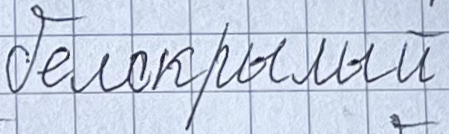белокрылый
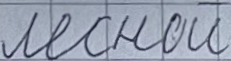лесной
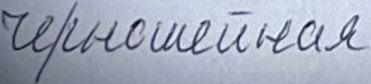черношейная
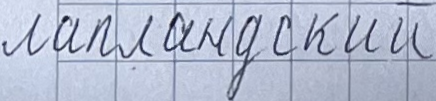лапландский
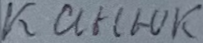канюк
